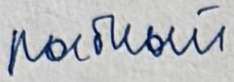рыбный
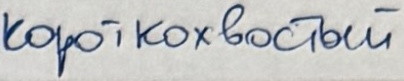короткохвостый
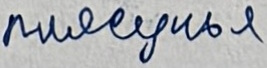плясунья
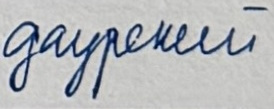даурский
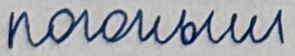погоныш
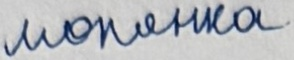мопянка
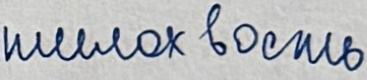шилох вость
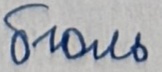бюль
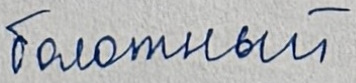болотный
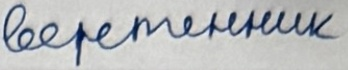веретенник
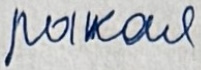рыжая
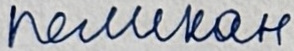пеликан
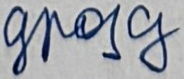дрозд
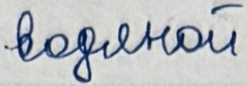водяной
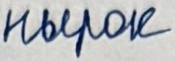нырок
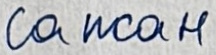сапсан
